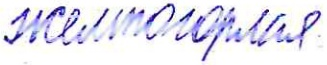желтогорлая
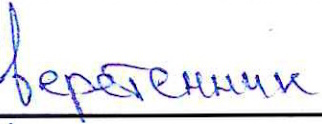веретенник
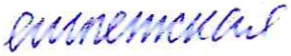египетская
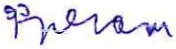фрегат
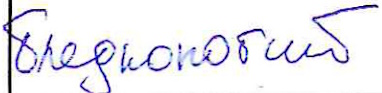бледноногий
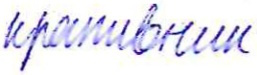крапивник
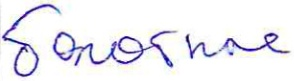болотная
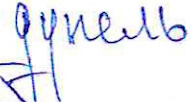дупель
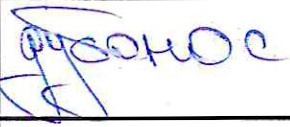дубонос
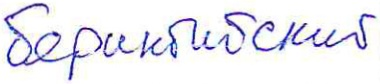берингийский
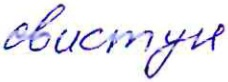свистун
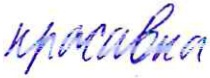красавка
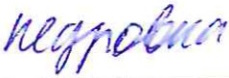кедровка
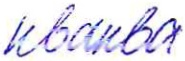кваква
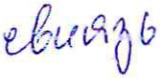свиязь
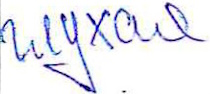глухая
